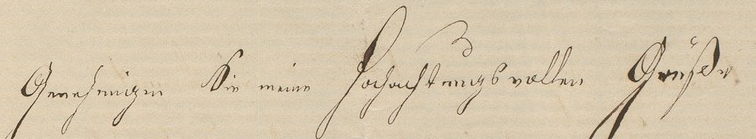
Genemigen sie meine hochachtungsvollen Grüße
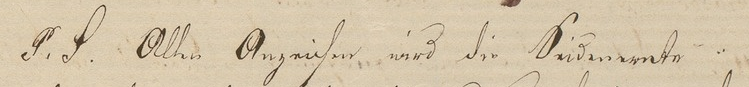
P. S. Allen Anzeichen wird die Seidenernte
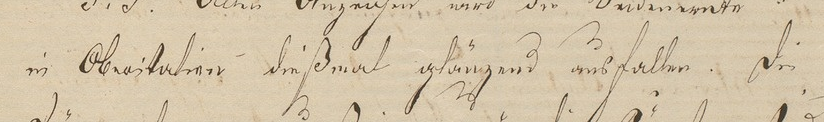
in Oberitalien dießmal glänzend ausfallen. Die
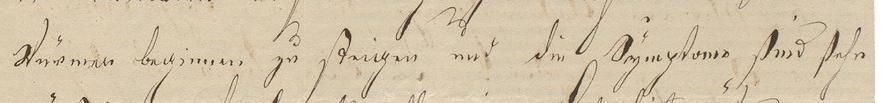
Würmer beginnen zu steigen und die Symptome sind sehr
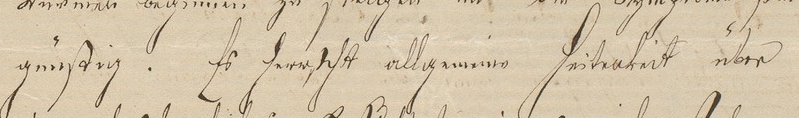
günstig. Es herrscht allgemeine Heiterkeit über
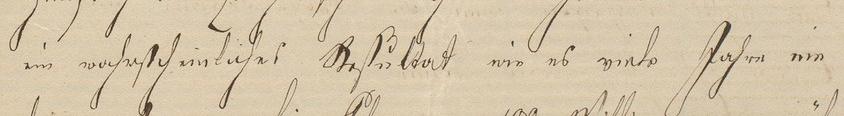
ein wahrscheinliches Resultat wie es viele Jahre nie
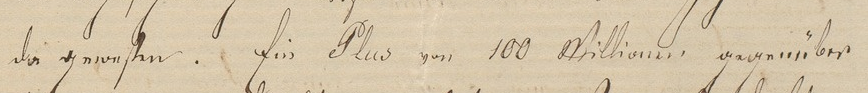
da gewesen. Ein Plus von 100 Millionen gegenüber
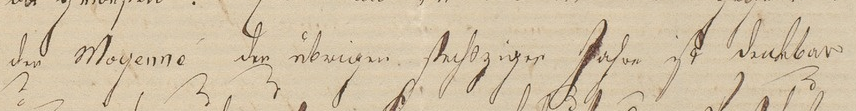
der Moyenné der übrigen secsziger Jahre ist denkbar
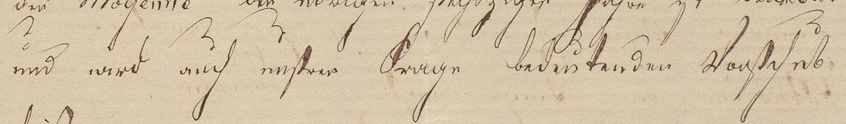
und wird auch unsrer Frage bedeutenden Vorschub
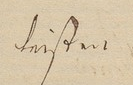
leisten.
